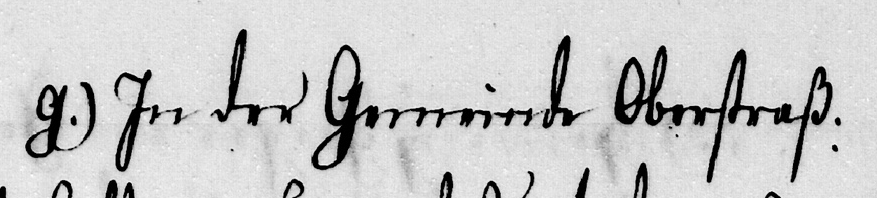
g.) In der Gemeinde Oberstraß.
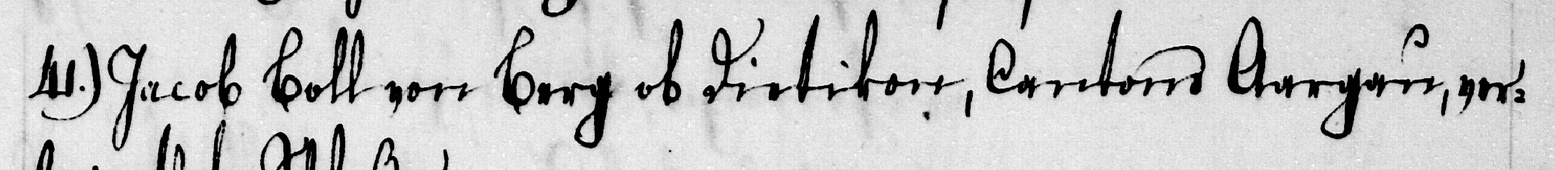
41.) Jacob Boll von Berg ob Dietikon, Cantons Aargau, ver¬
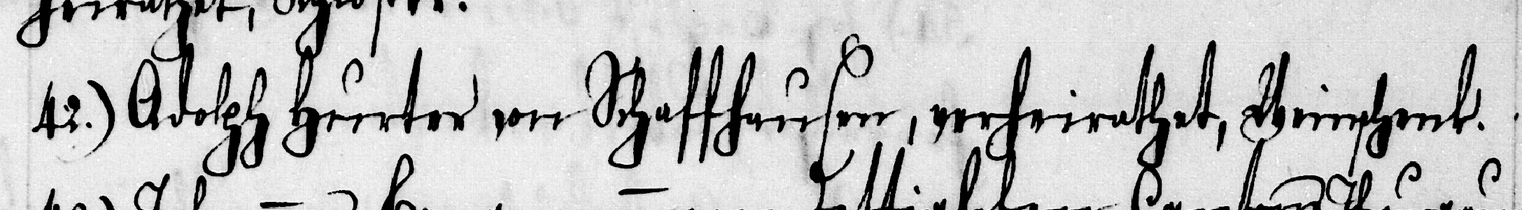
42.) Adolph Hurter von Schaffhausen, verheirathet, Weinschenk.
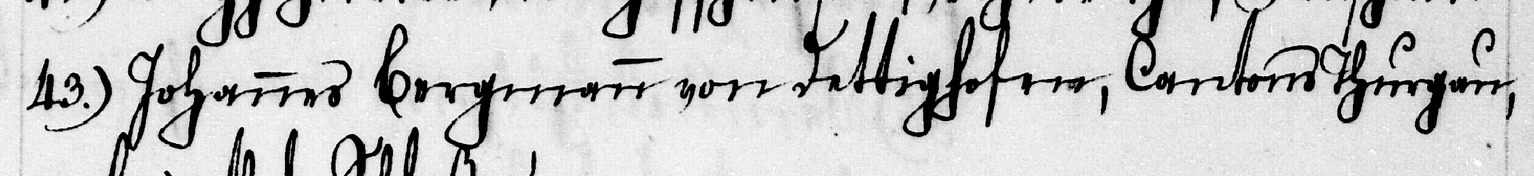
43.) Johannes Bergmann von Dettighofen, Cantons Thurgau,
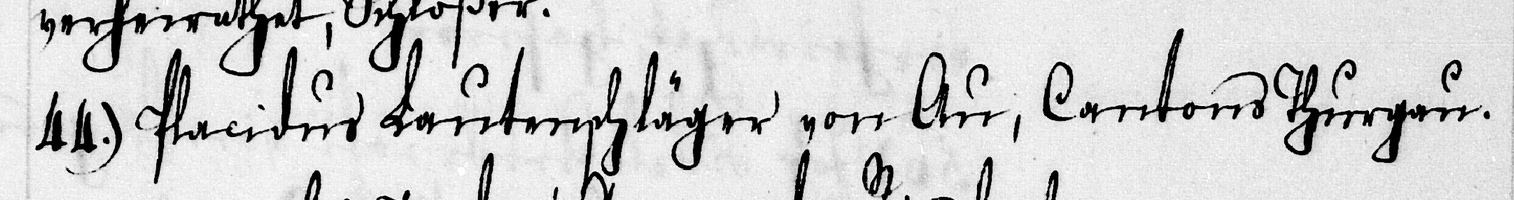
44.) Placidus Lautenschläger von Au, Cantons Thurgau.
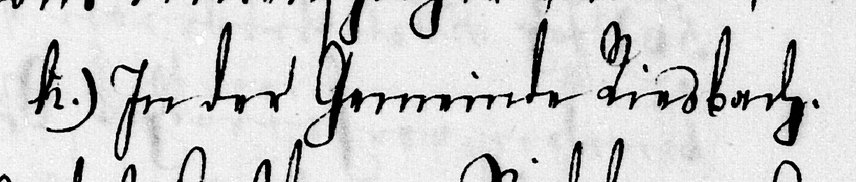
h.) In der Gemeinde Riesbach.
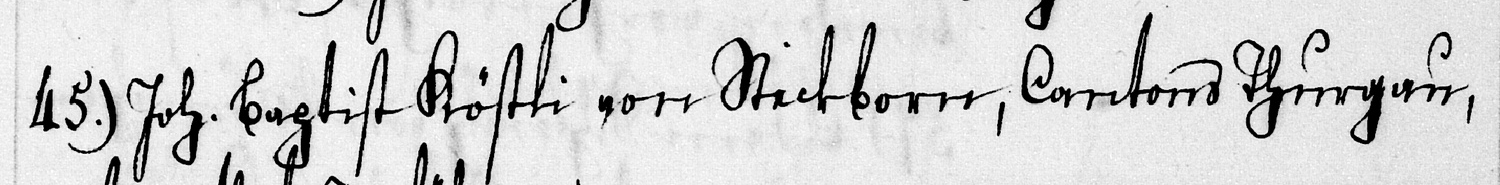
45.) Joh. Baptist Köstli von Steckborn, Cantons Thurgau,
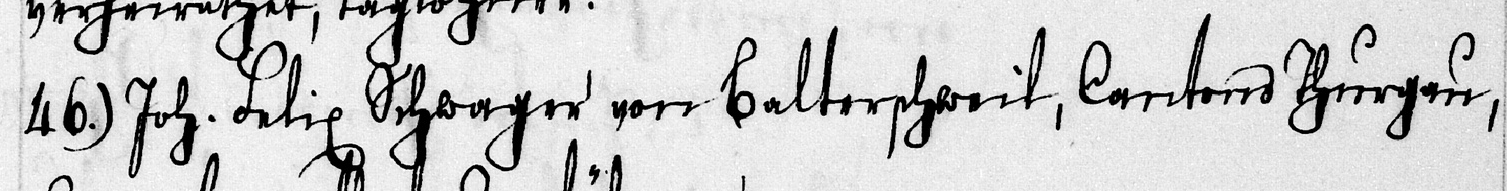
46.) Joh. Felix Schwager von Balterschweil, Cantons Thurgau,
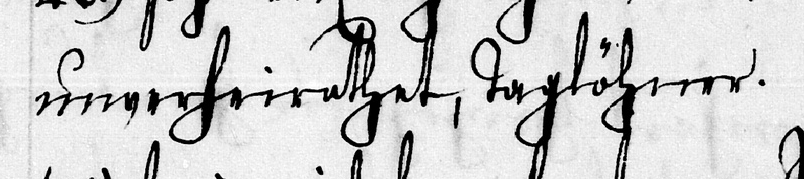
unverheirathet, Taglöhner.
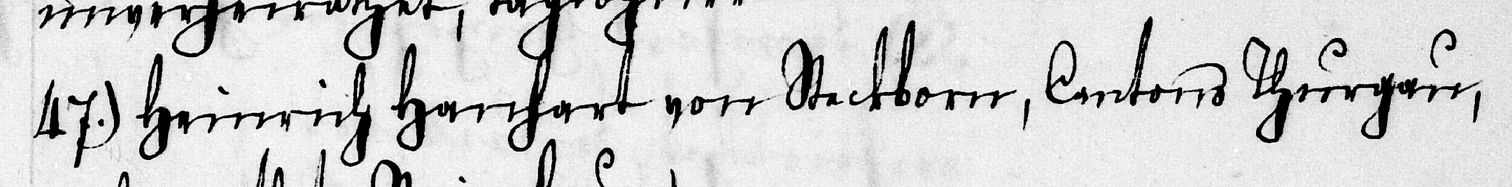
47.) Heinrich Hanhart von Steckborn, Cantons Thurgau,
